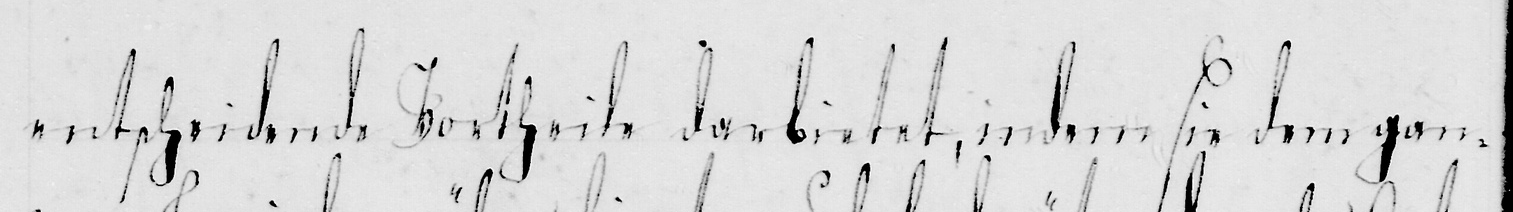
entscheidende Vortheile darbietet, indem sie dem gan¬
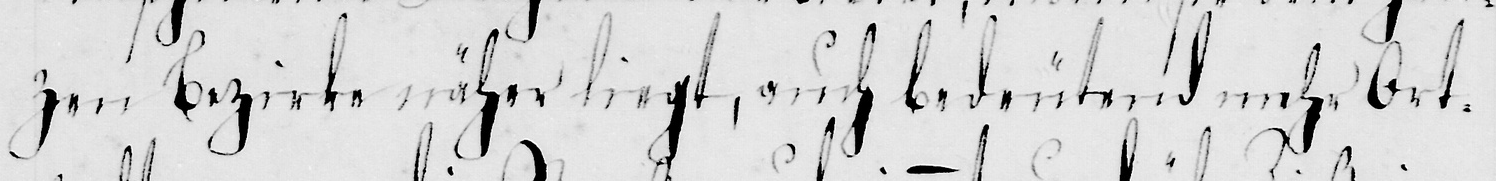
zen Bezirke näher liegt, auch bedeutend mehr Ort¬
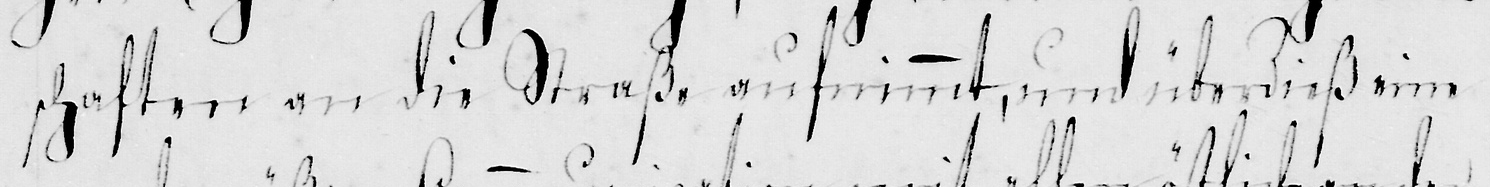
schaften an die Straße aufnimmt, und überdieß eine
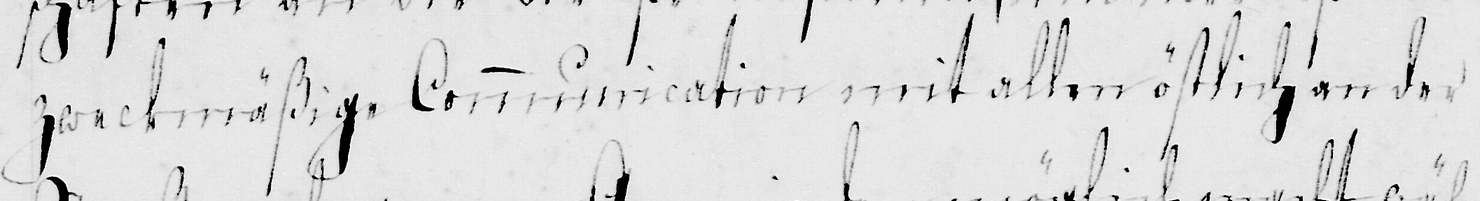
zweckmäßige Communication mit allen östlichen an der
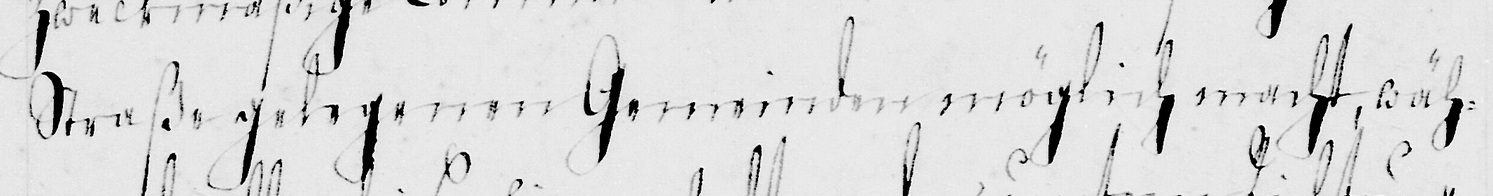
Straße gelegenen Gemeinden möglich macht, wäh¬
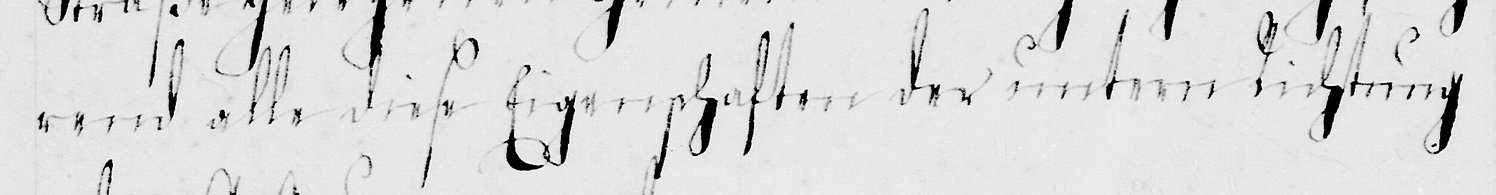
rend alle diese Eigenschaften der untern Richtung
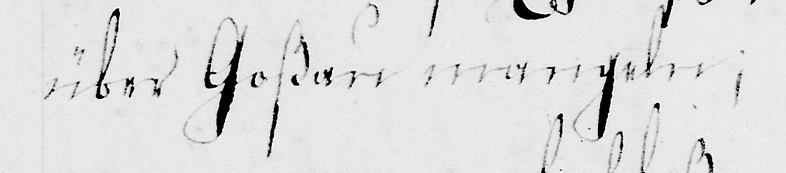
über Goßau mangeln;
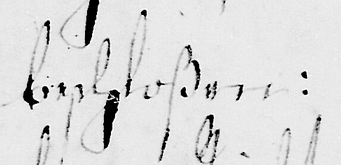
beschloßen:
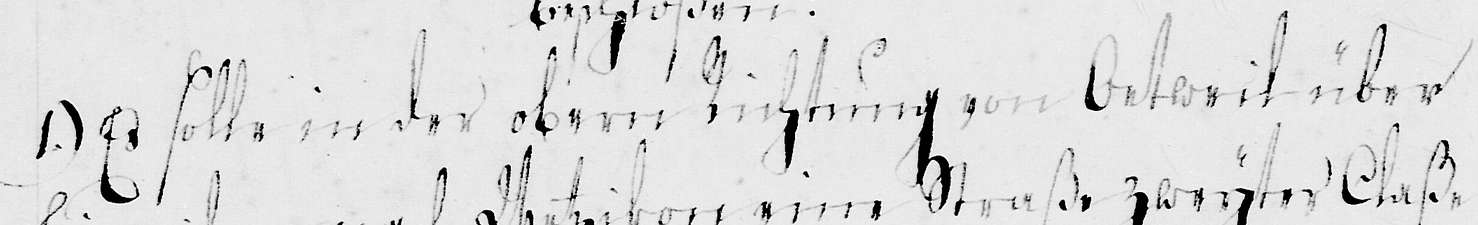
1.) Es solle in der obern Richtung von Oetweil über
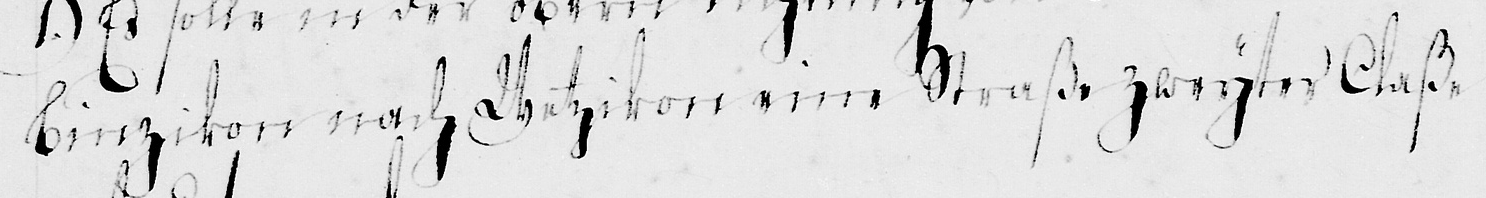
Binzikon nach Wetzikon eine Straße zweyter Claße
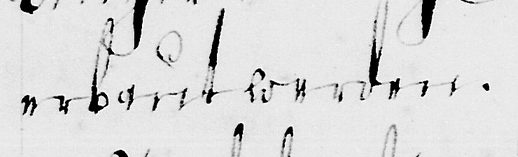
erbaut werden.
